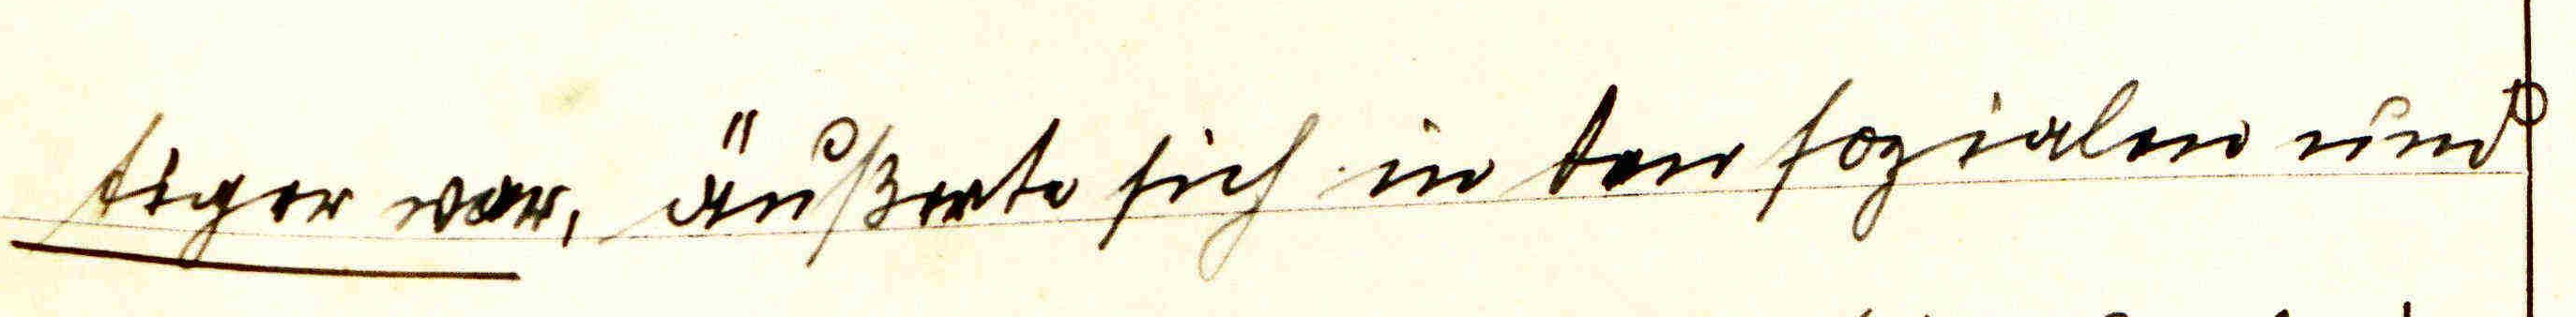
tiger war, äußerte sich in den sozialen und
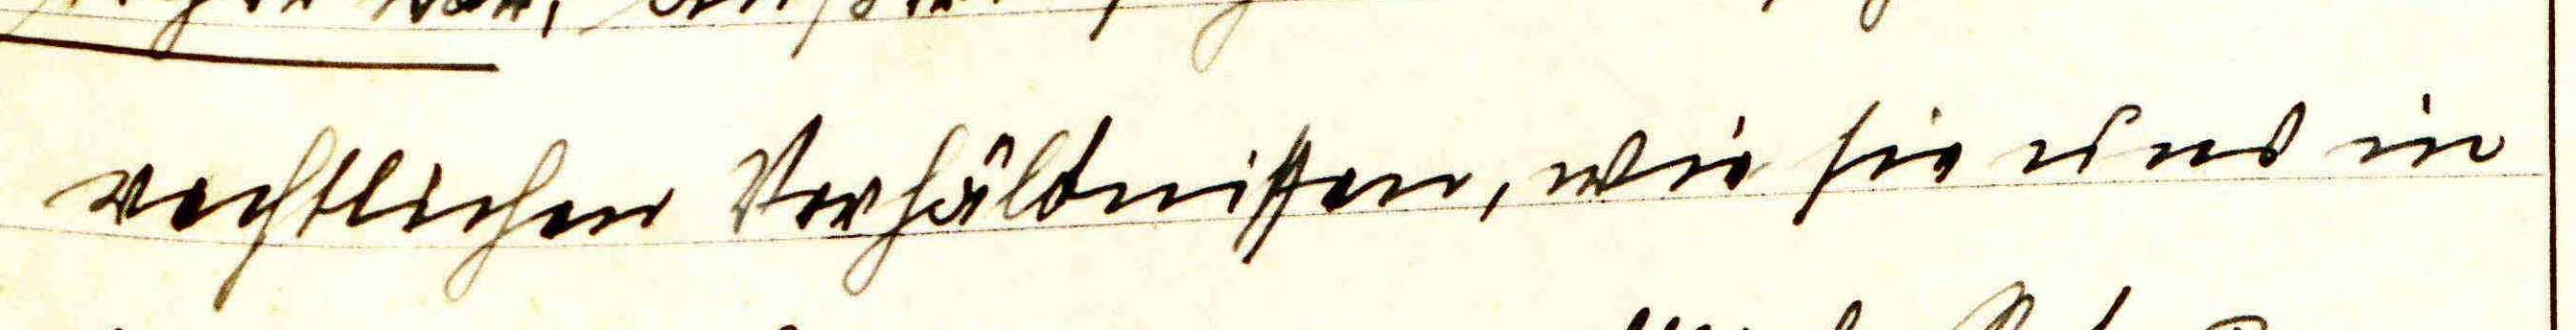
rechtlichen Verhältnissen, wie sie uns in
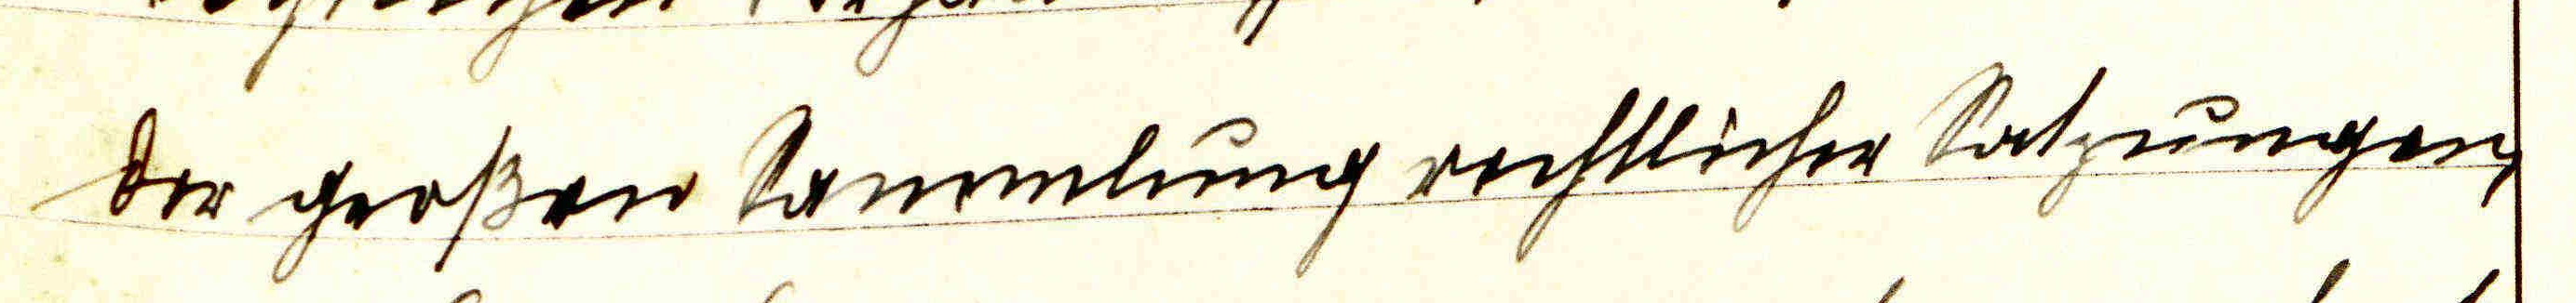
der großen Sammlung rechtlicher Satzungen,
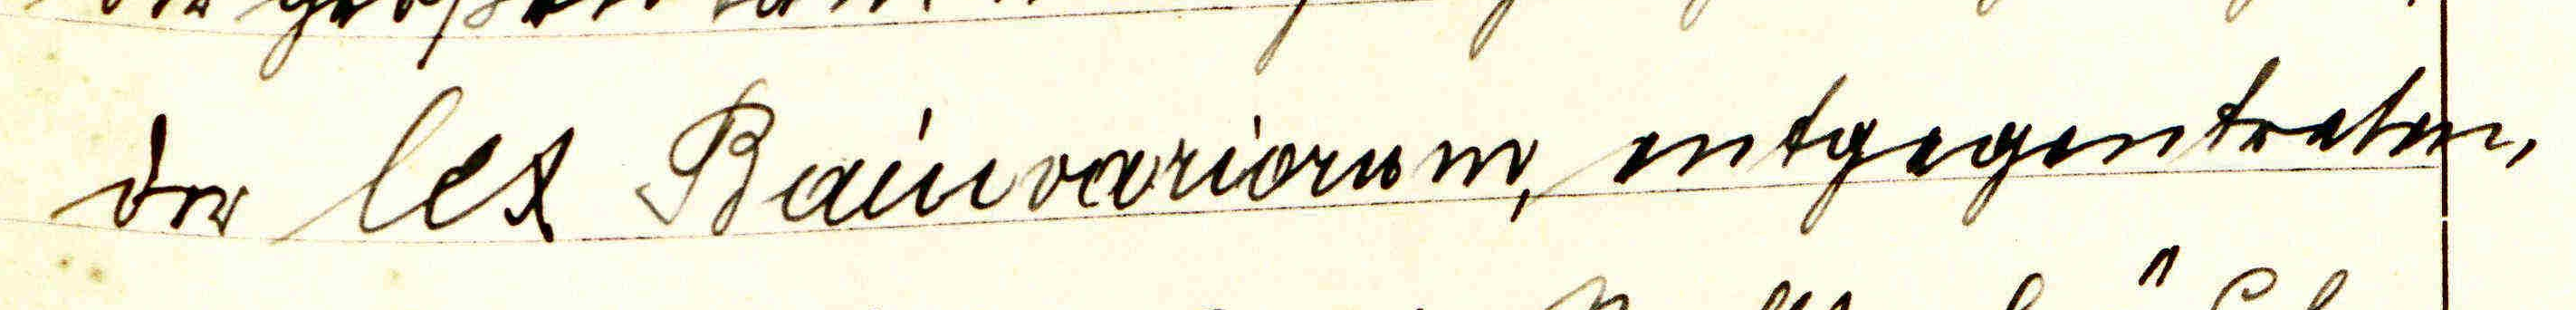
der Lex Baiuvariorum, entgegentraten,
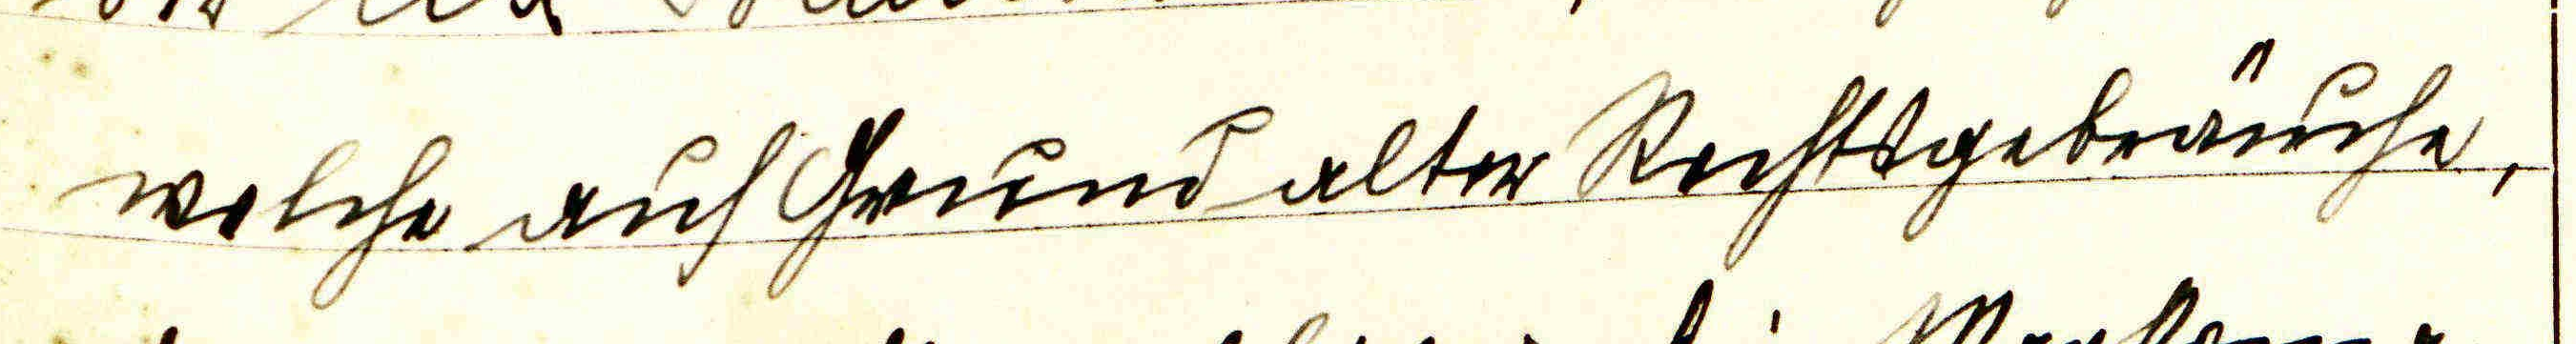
welche auf Grund alter Rechtsgebräuche,
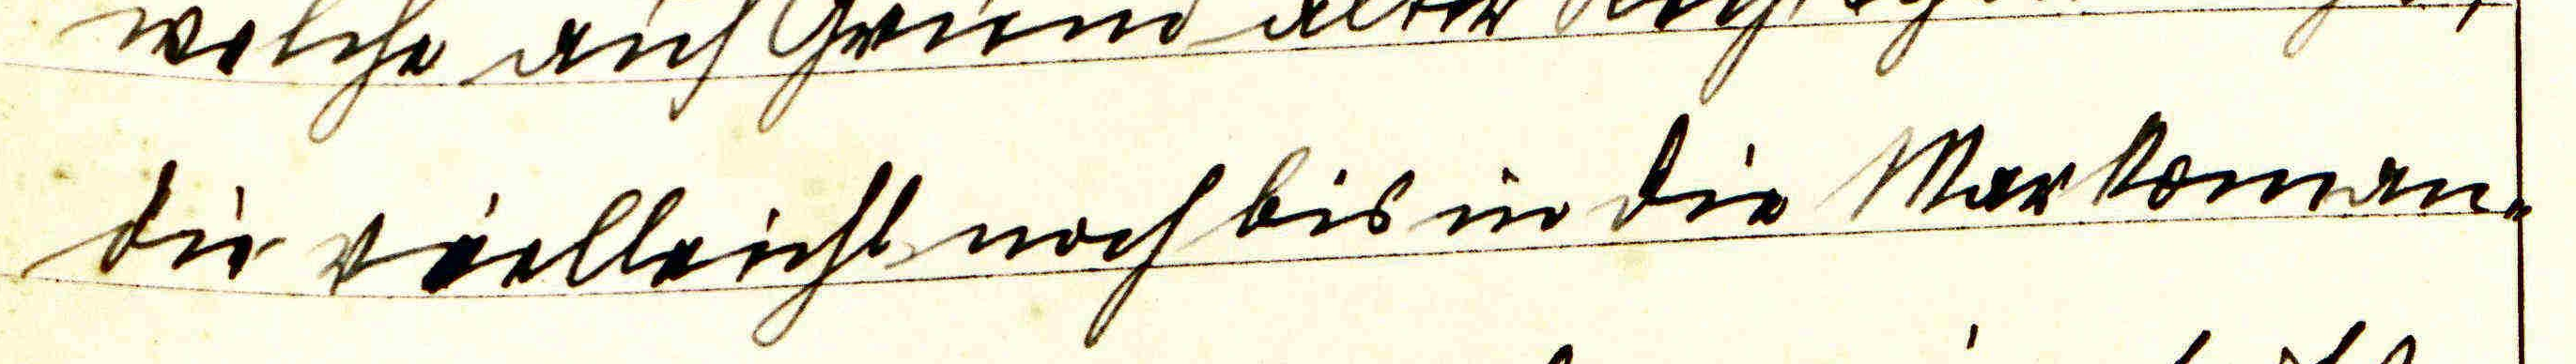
die vielleicht noch bis in die Markoman-
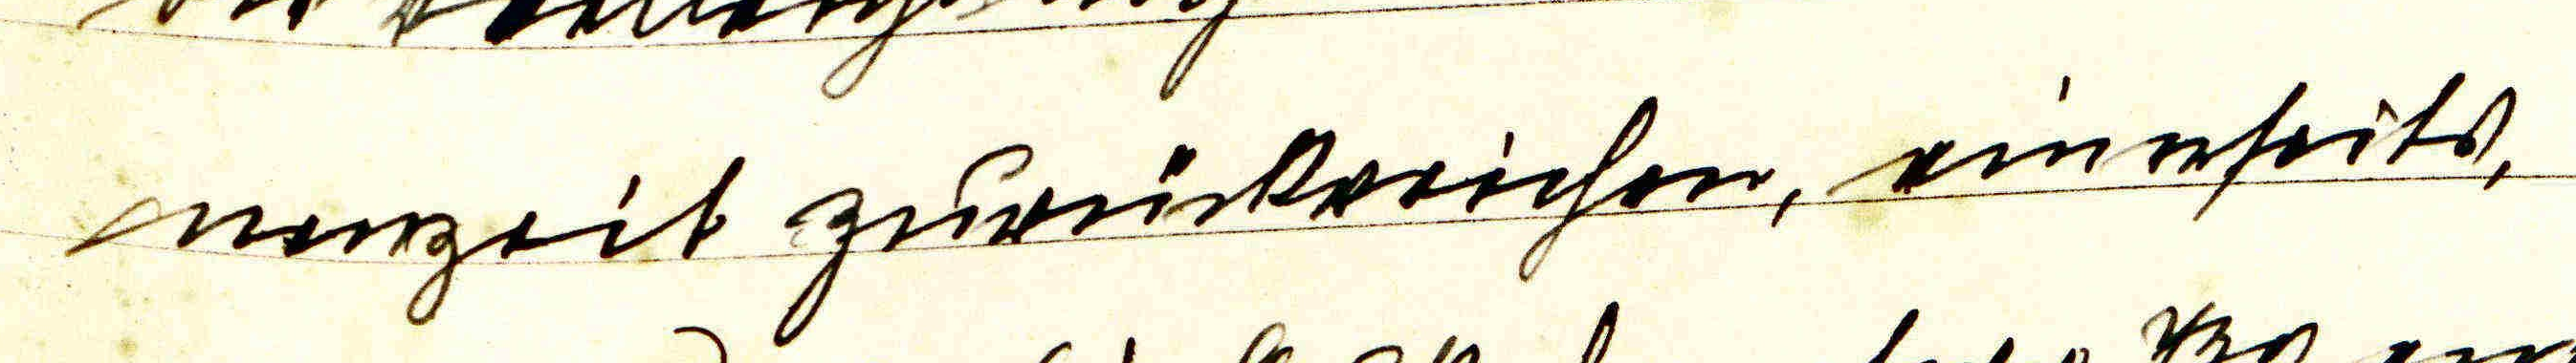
enzeit zurückreichen, einerseits,
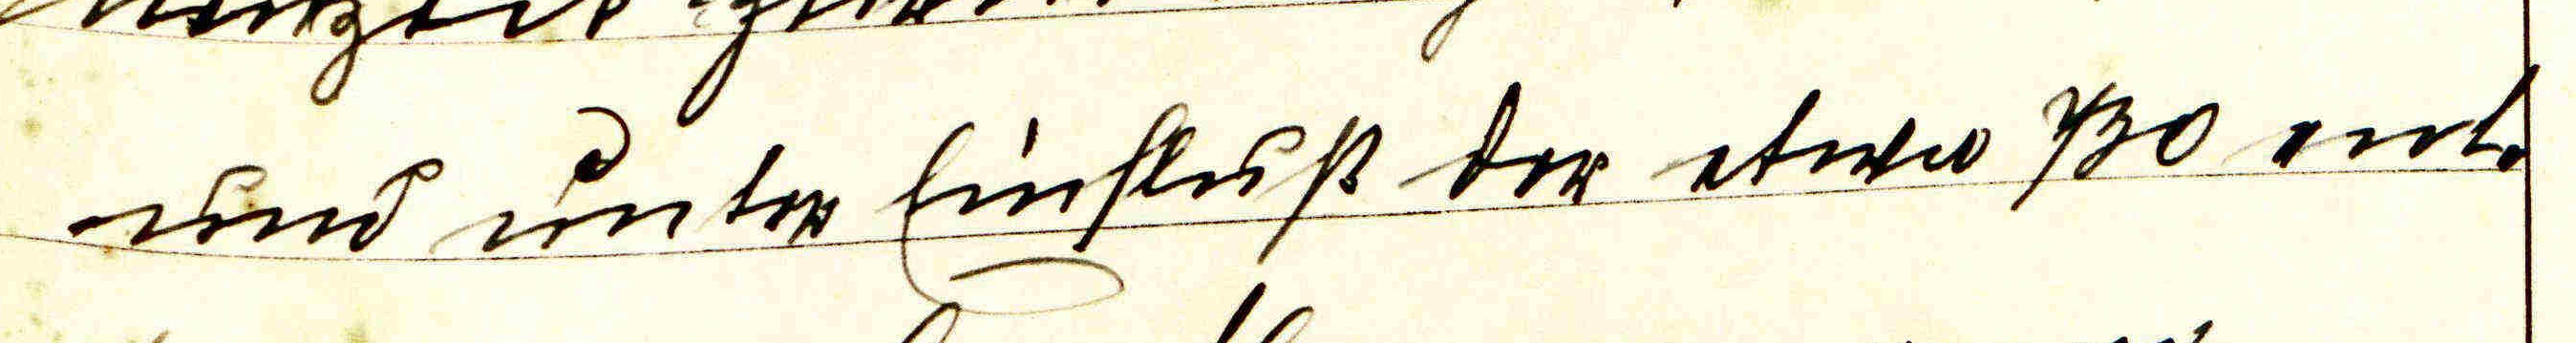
und unter Einfluß der etwa 730 ent-
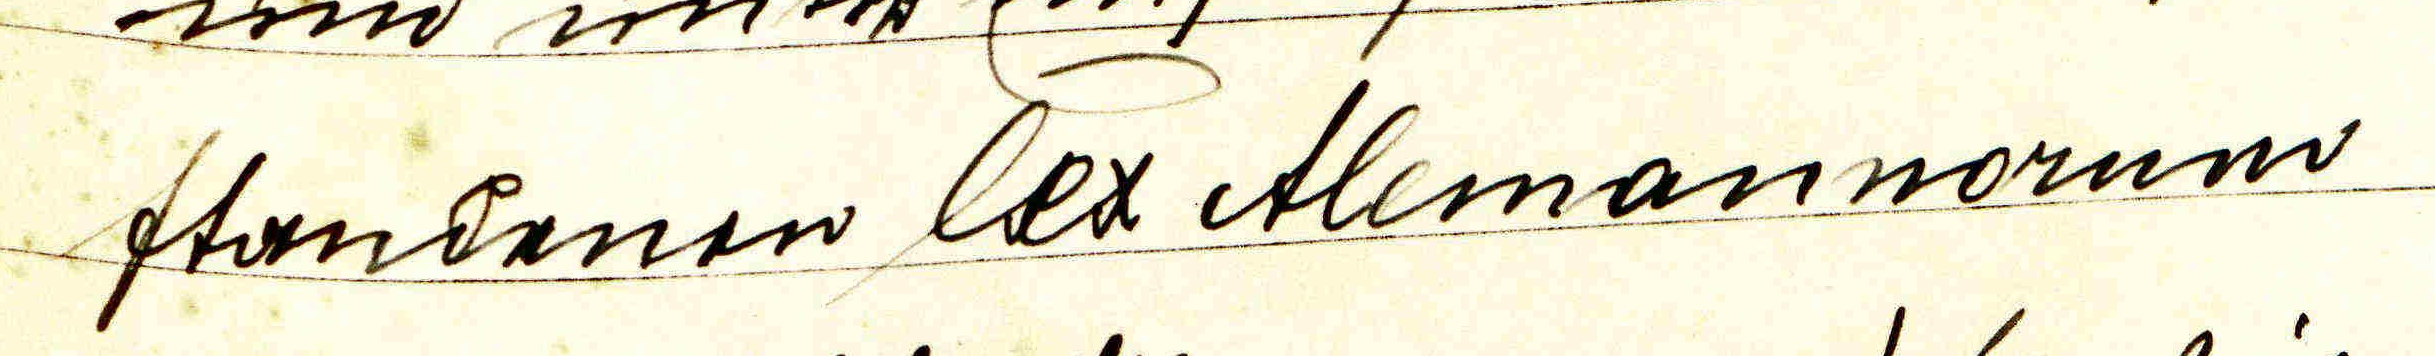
standenen Lex Alemannorum
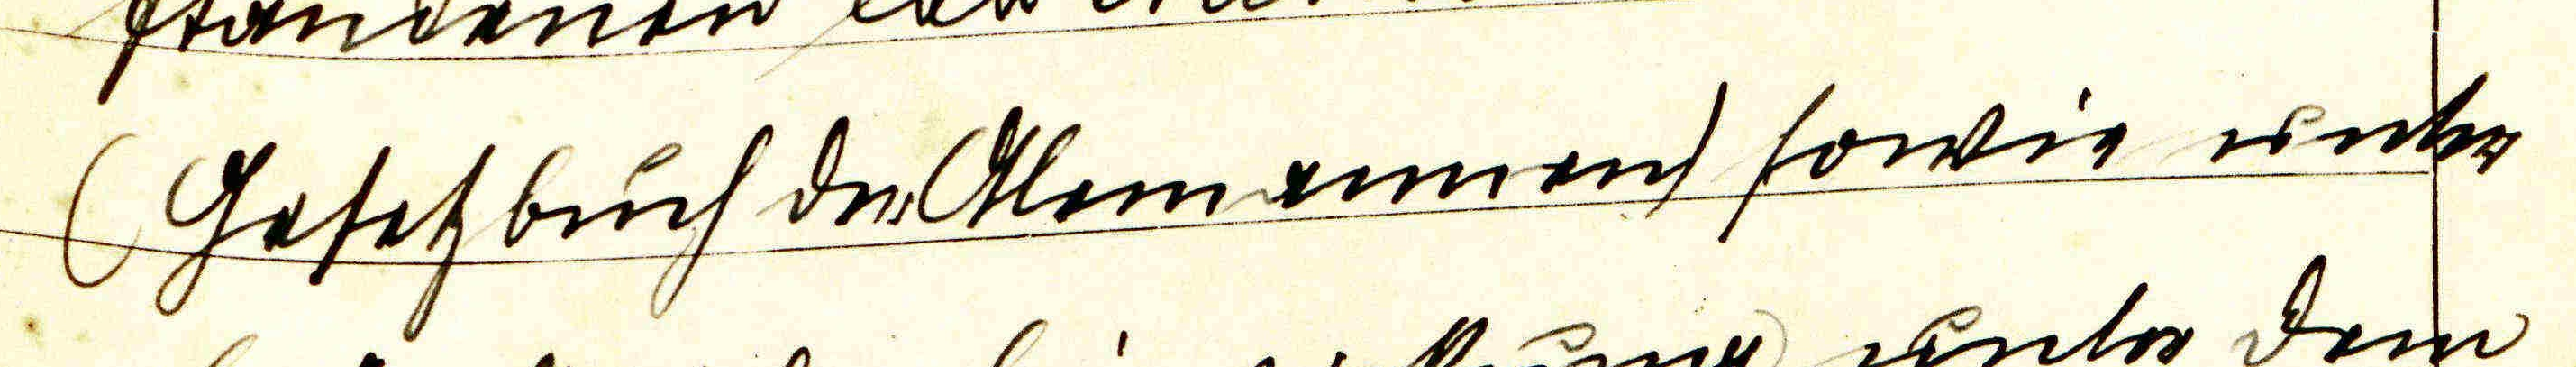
(Gesetzbuch der Alemannen) sowie unter
